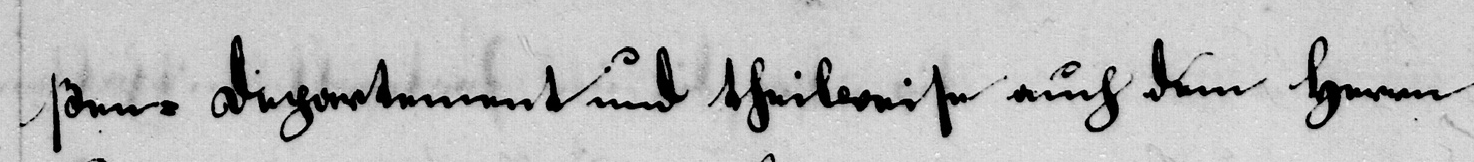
ßen-Departement und theilweise auch dem Herrn
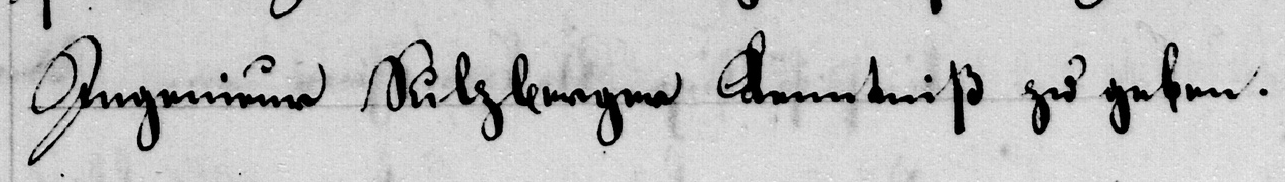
Ingenieur Sulzberger Kenntniß zu geben.
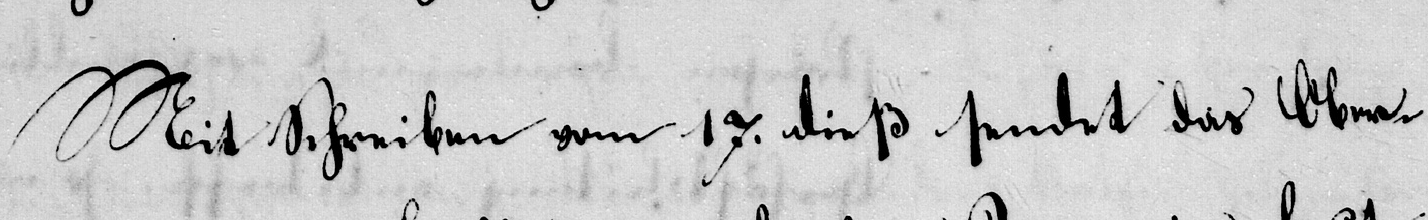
Mit Schreiben vom 17. dieß sendet das Ober¬
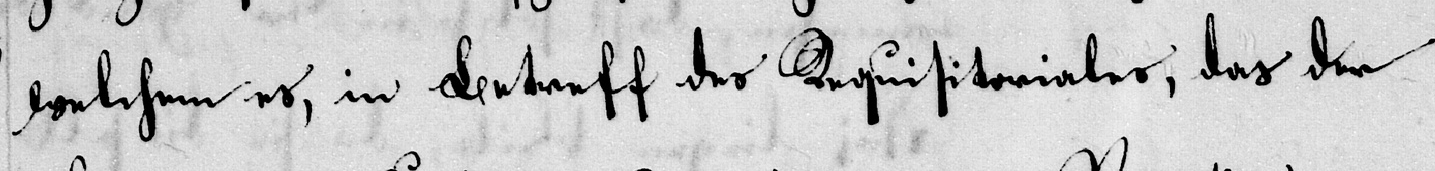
welchem es, in Betreff des Requisitoriales, das der
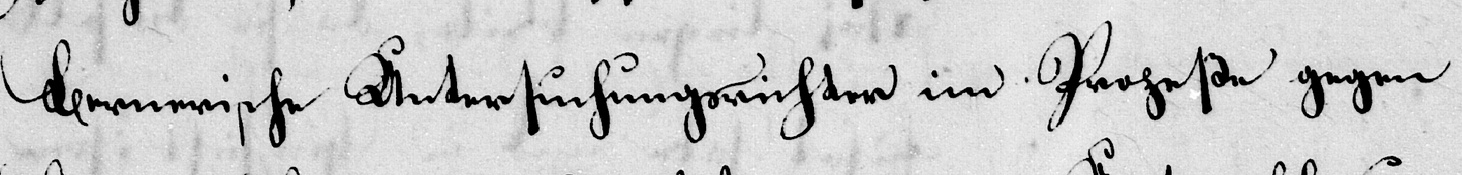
Bernerische Untersuchungsrichter im Prozeße gegen
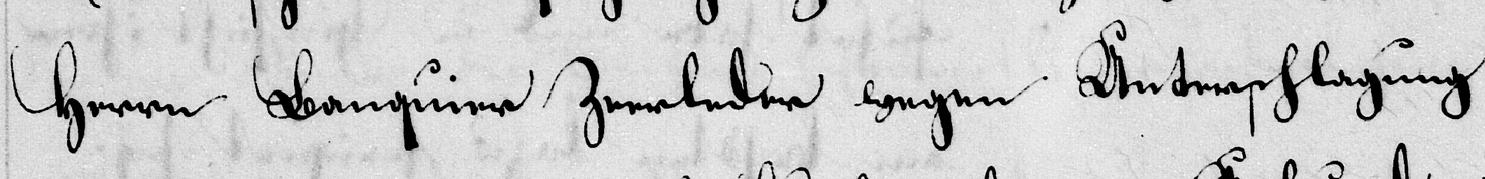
Herrn Banquier Zeerleder wegen Unterschlagung
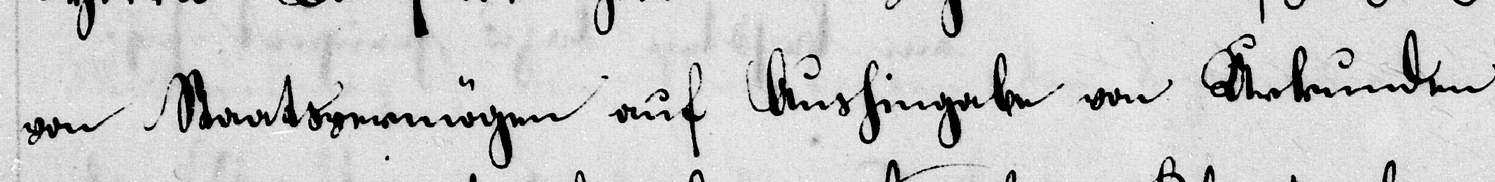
von Staatsvermögen auf Aushingabe von Urkunden
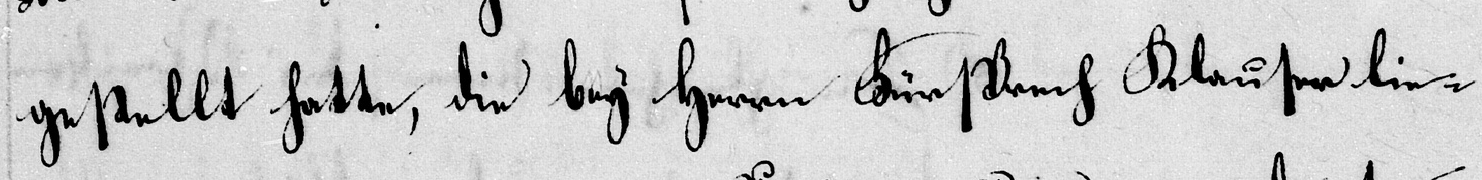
gestellt hatte, die bey Herrn Fürsprech Klauser lie¬
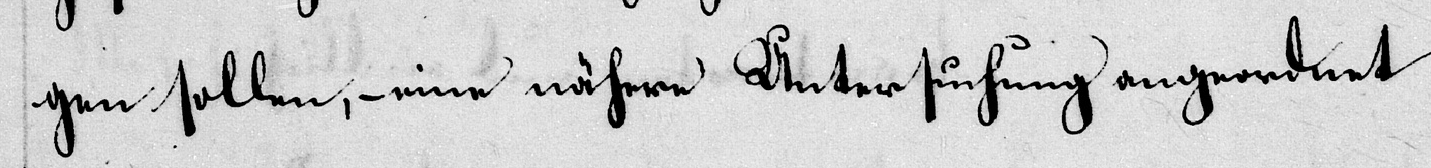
gen sollen, – eine nähere Untersuchung angeordnet
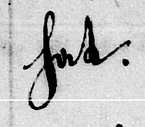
hat.
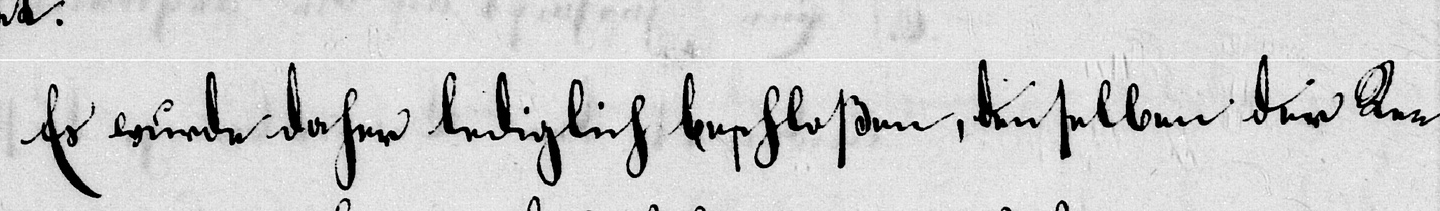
Es wurde daher lediglich beschloßen, denselben der Re¬
